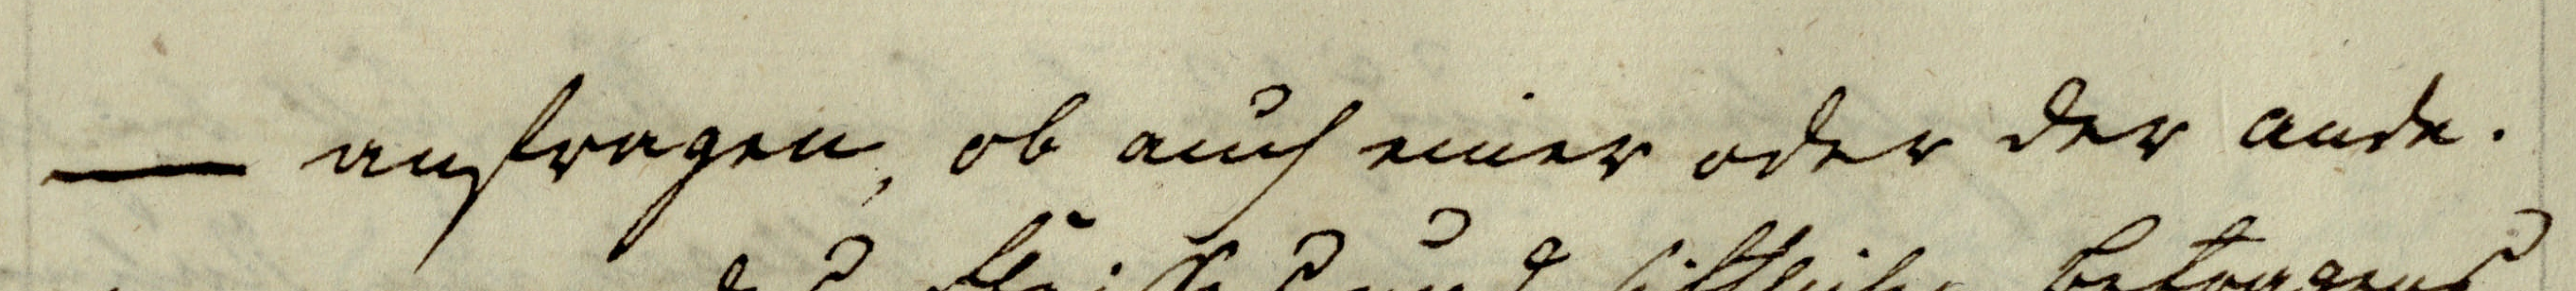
anfragen, ob auch einer oder der ande¬
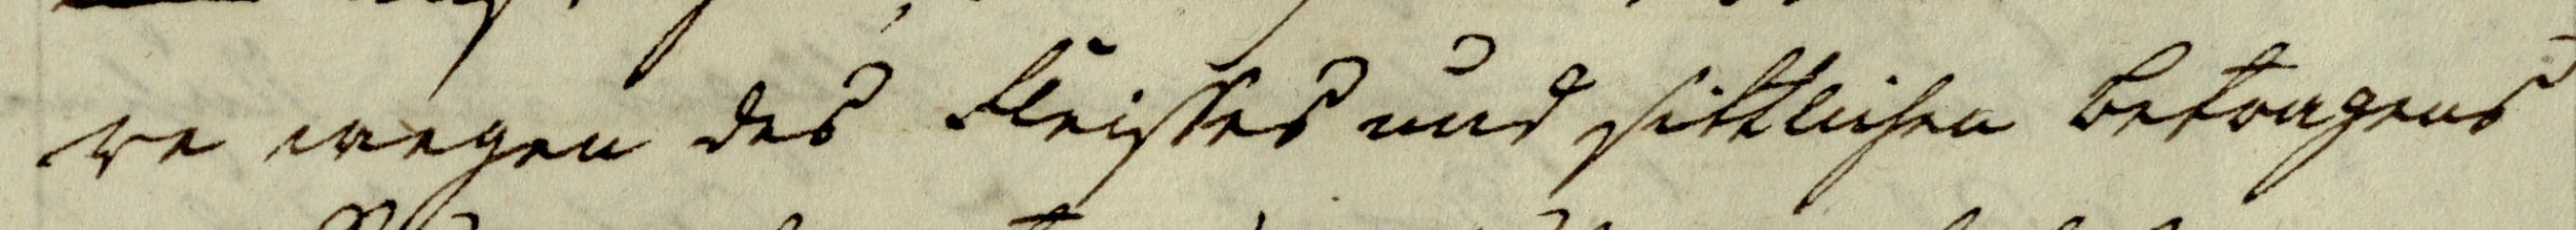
re wegen des Fleisses und sittlichen Betragens
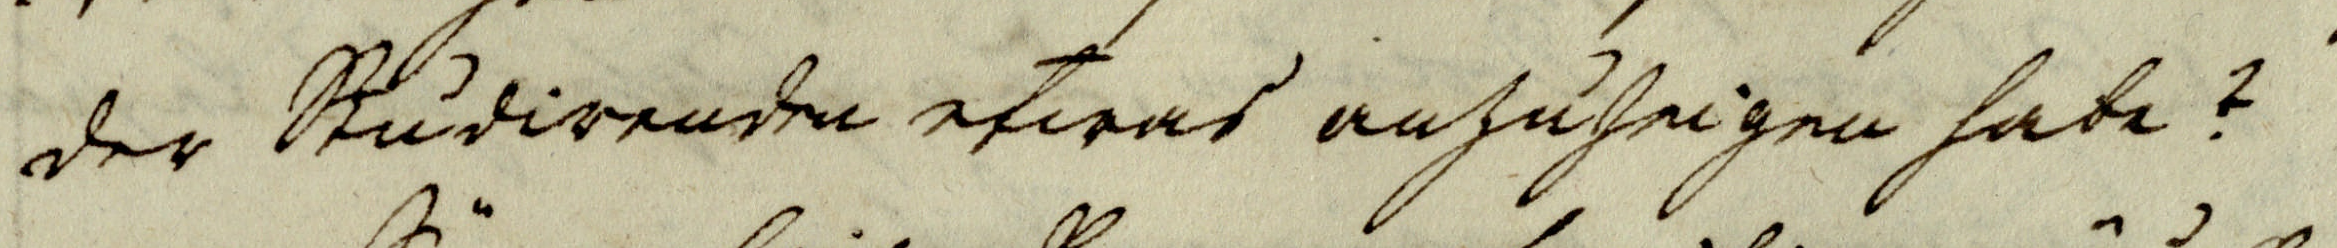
der Studirenden etwas anzuzeigen habe?
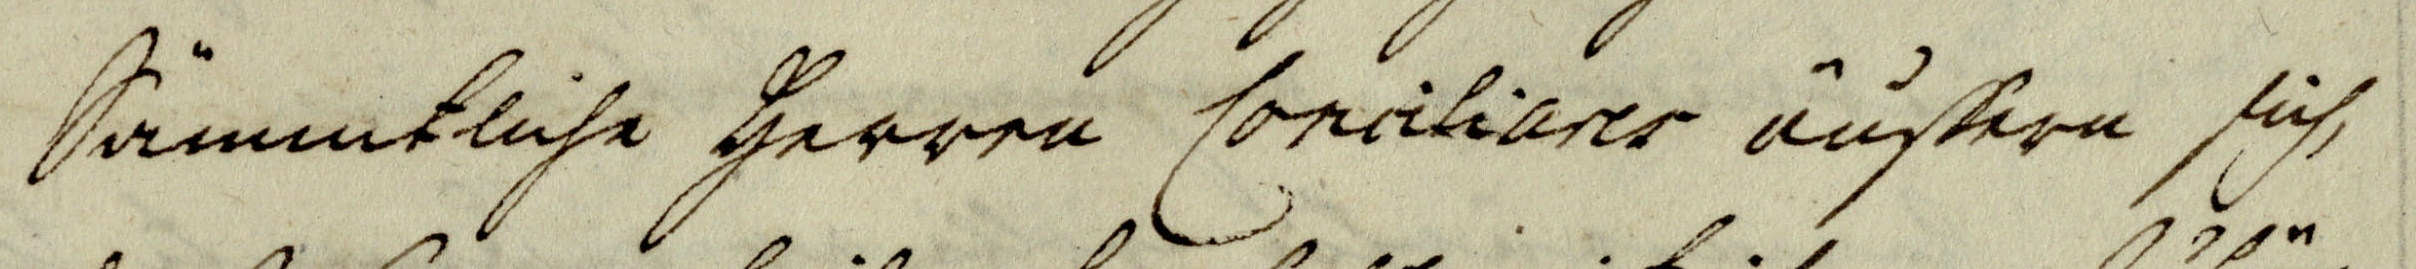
Sämmtliche Herren Conciliares äussern sich,
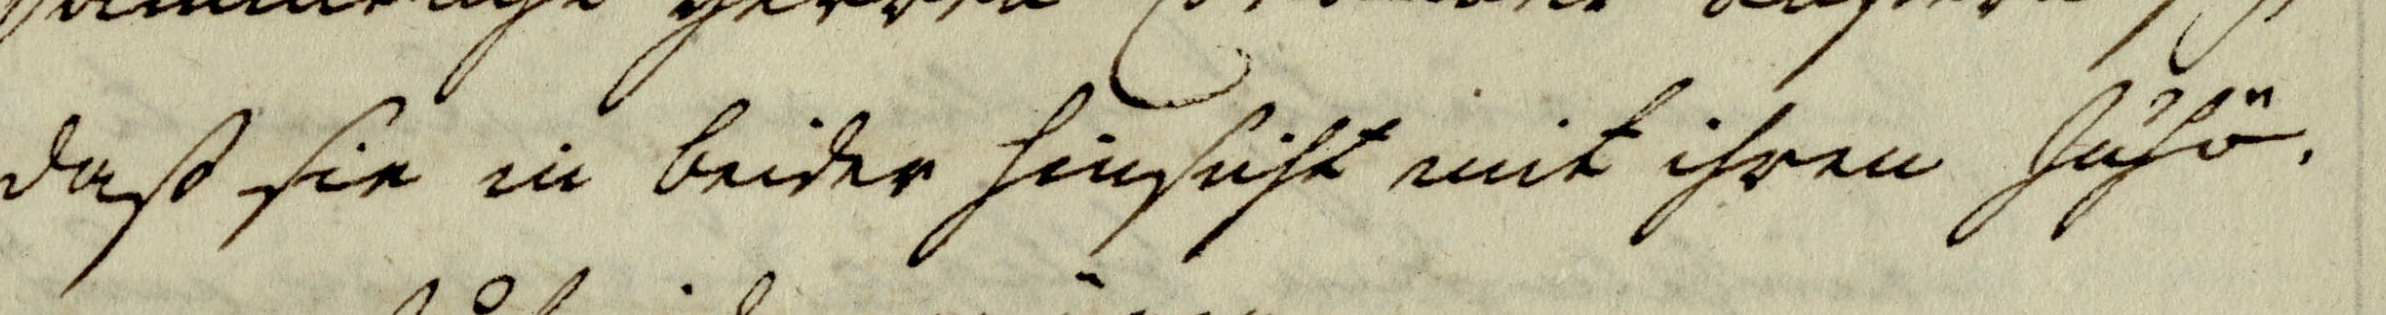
daß sie in beider Hinsicht mit ihren Zuhö¬
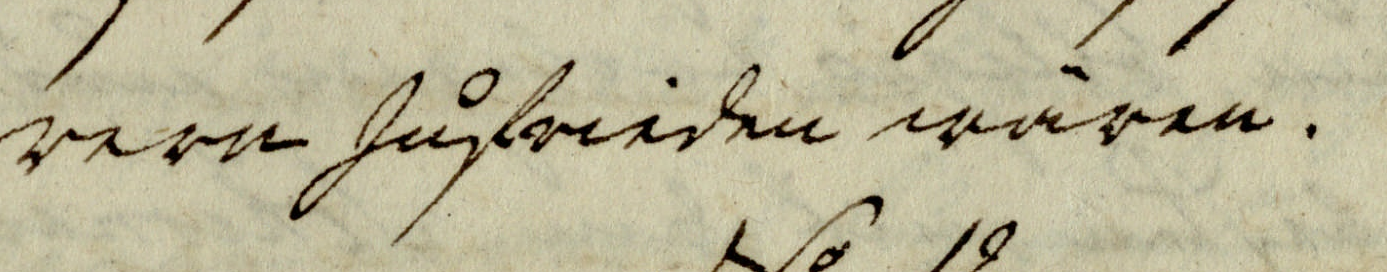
rern zufrieden wären.
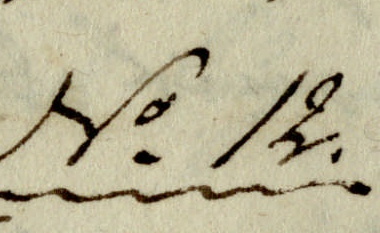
No 12.
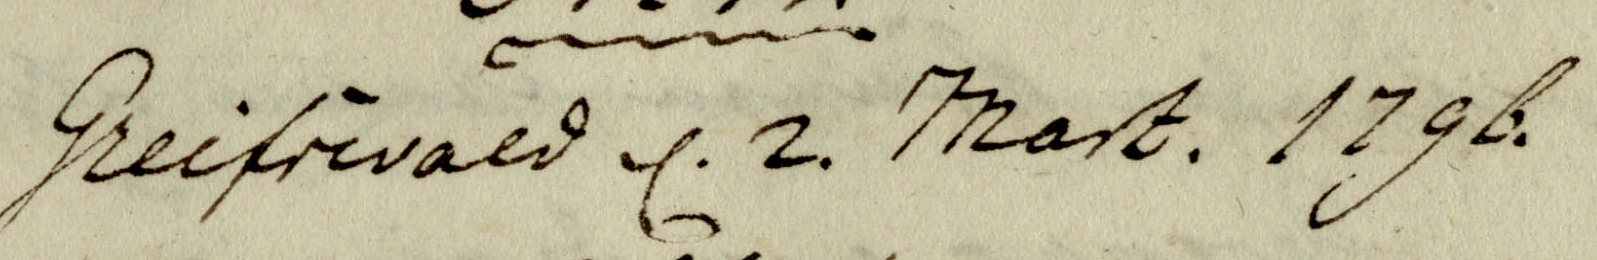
Greifswald d. 2. Mart. 1796.
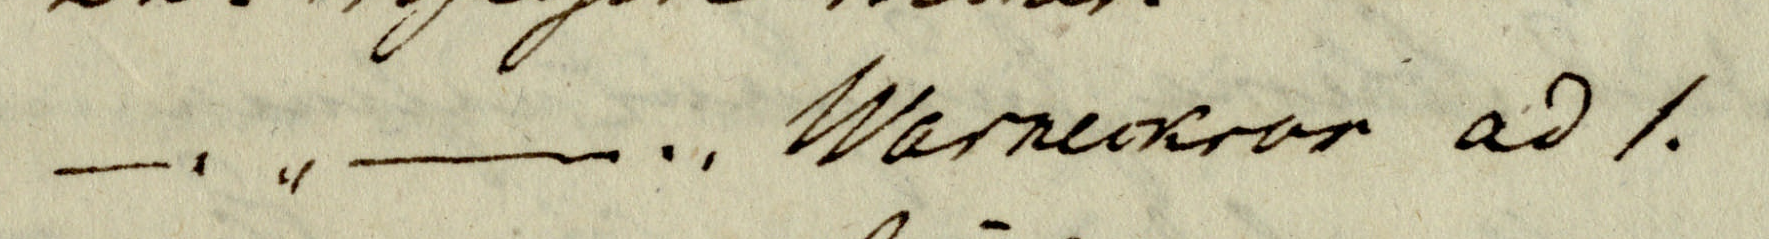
Warneckros ad 1.
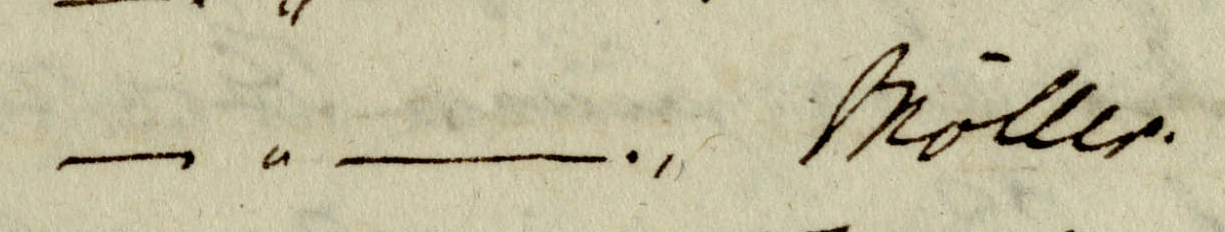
Möller.
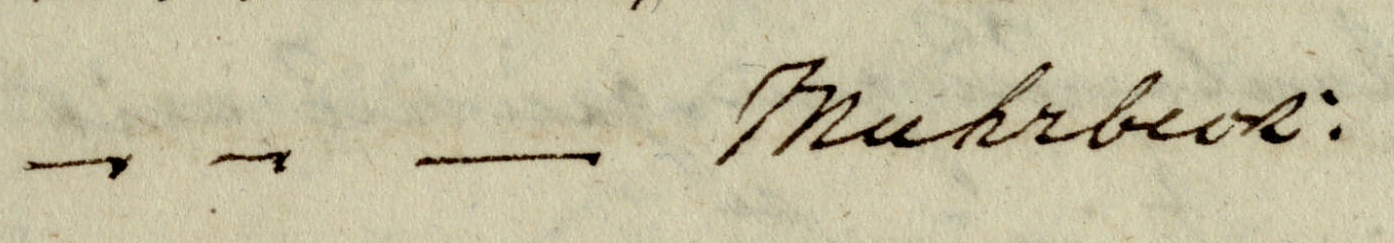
Muhrbeck.
